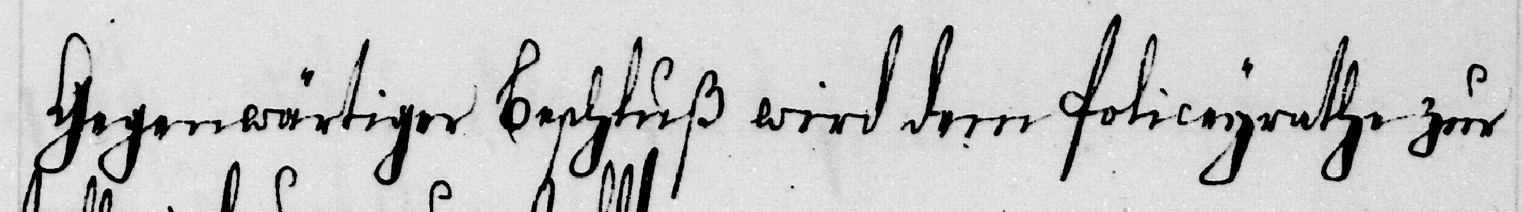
Gegenwärtiger Beschluß wird dem Policeyrathe zur
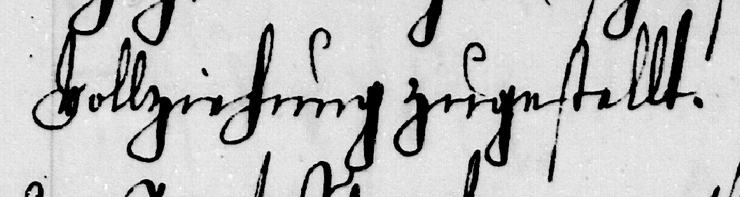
Vollziehung zugestellt.
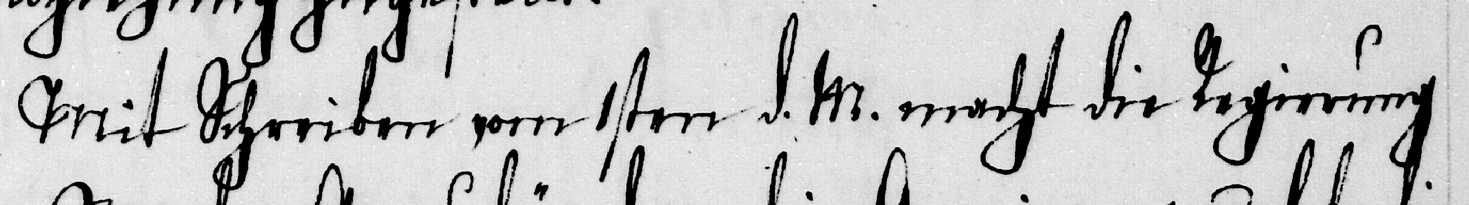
Mit Schreiben vom 1sten d. M. macht die Regierung
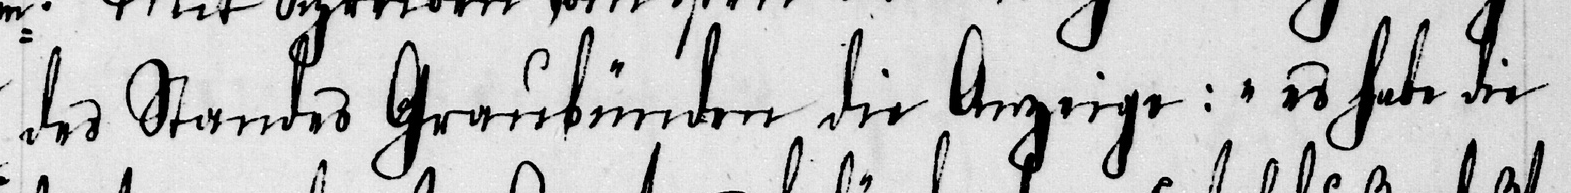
des Standes Graubünden die Anzeige: „es habe die
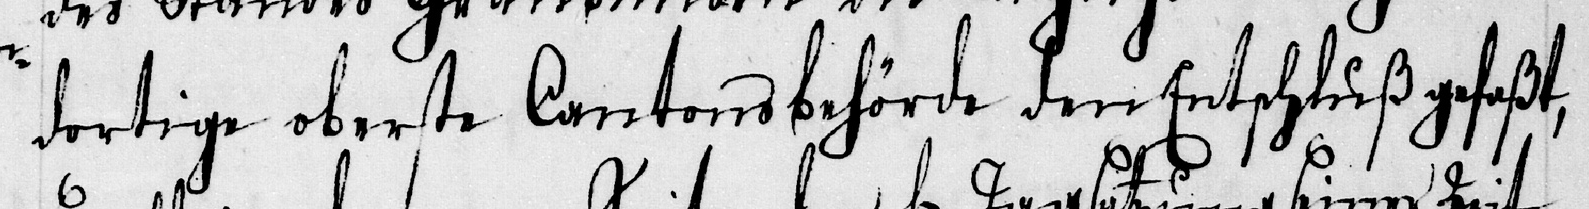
dortige oberste Cantonsbehörde den Entschluß gefaßt,
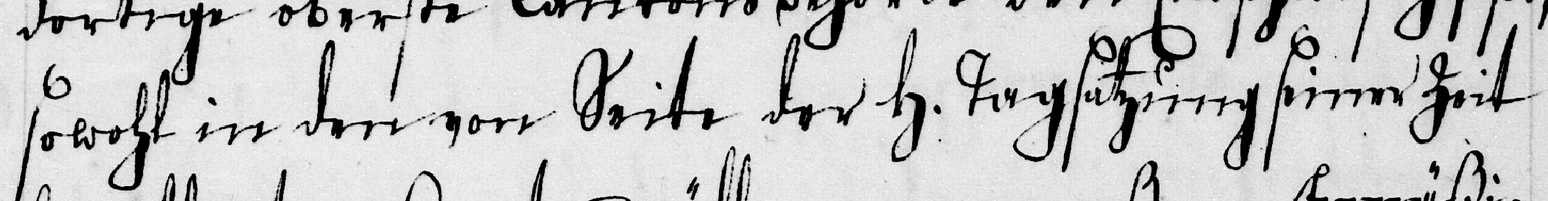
sowohl in den von Seite der H. Tagsatzung seiner Zeit
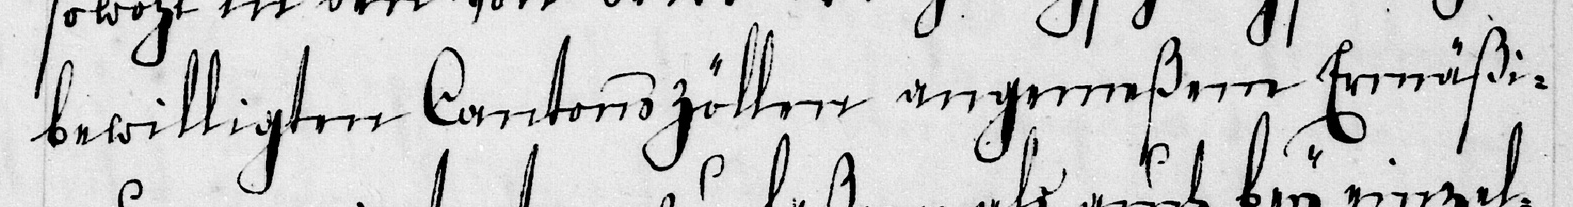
bewilligten Cantonszöllen angemeßenen Ermäßi¬
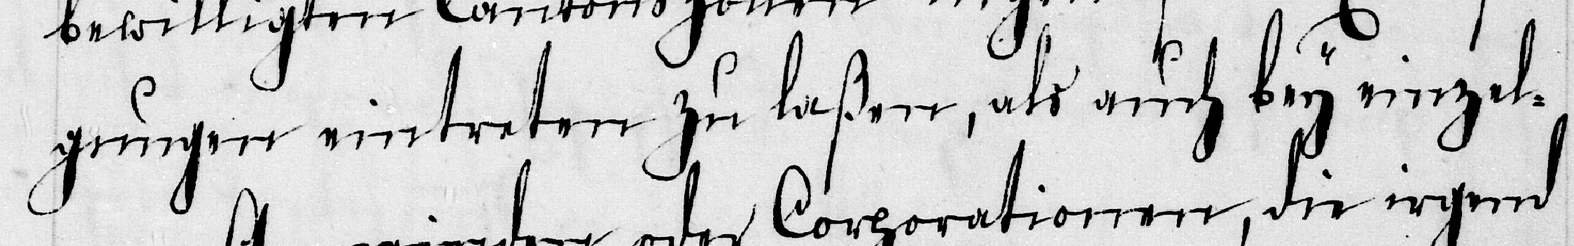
gungen eintreten zu laßen, als auch bey einzel¬
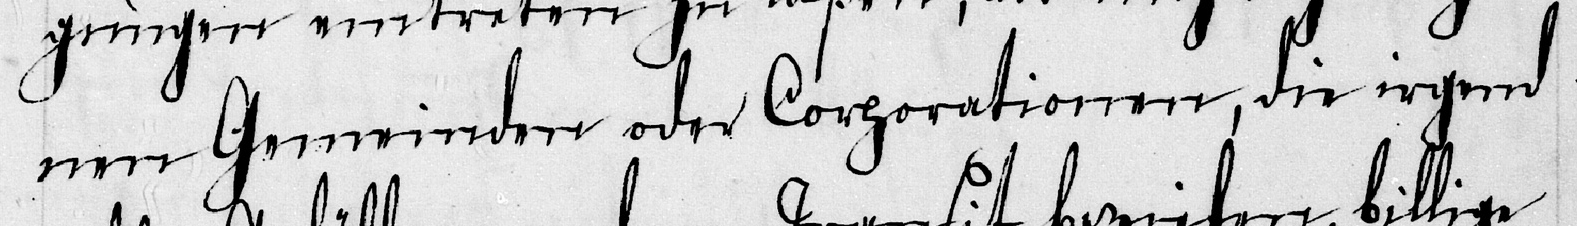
nen Gemeinden oder Corporationen, die irgend¬
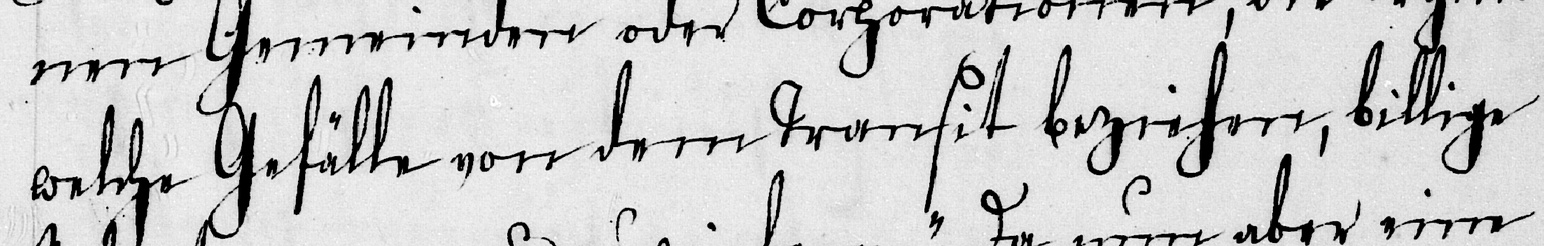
welche Gefälle von dem Transit beziehen, billige
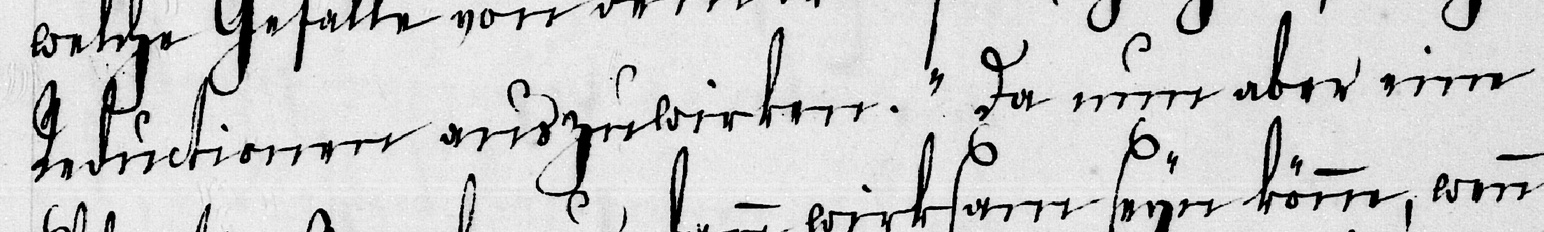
Reductionen auszuwirken.“ Da nun aber eine
